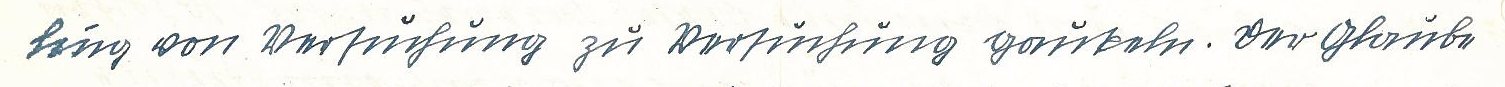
ling von Versuchung zu Versuchung gaukeln. Der Glaube
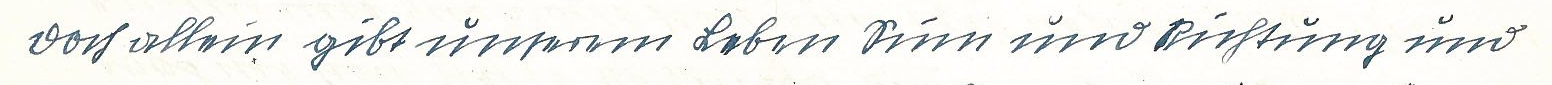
doch allein gibt unserem Leben Sinn und Richtung und
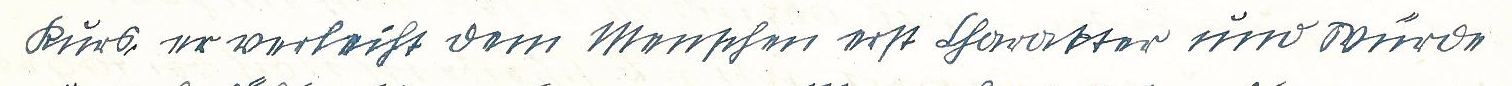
Kurs, er verleiht dem Menschen erst Charakter und Würde
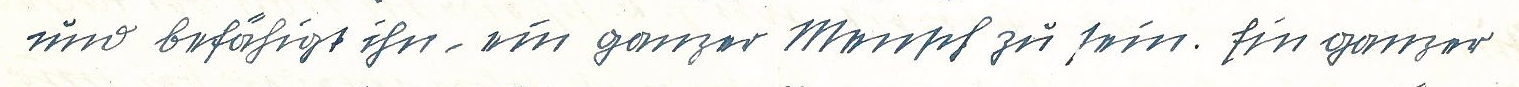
und befähigt ihn, ein ganzer Mensch zu sein. Ein ganzer
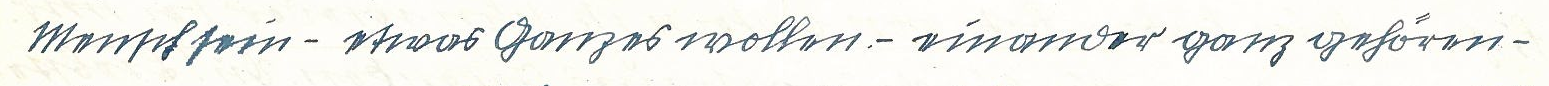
Mensch sein – etwas Ganzes wollen – einander ganz gehören –
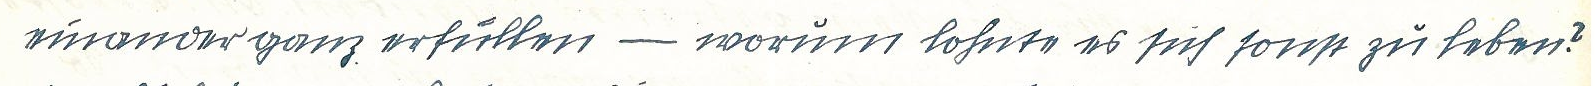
einander ganz erfüllen – worum lohnte es sich sonst zu leben?
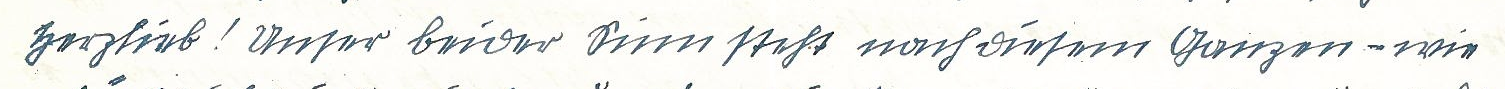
Herzlieb! Unser beider Sinn steht nach diesem Ganzen – wie
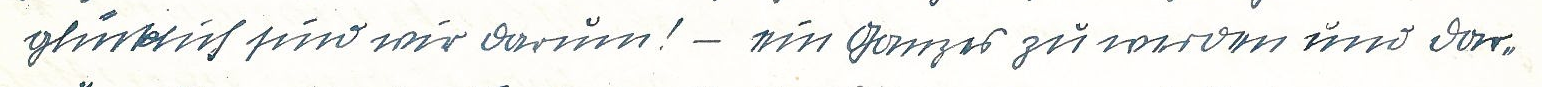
glücklich sind wir darum! – ein Ganzes zu werden und dar¬
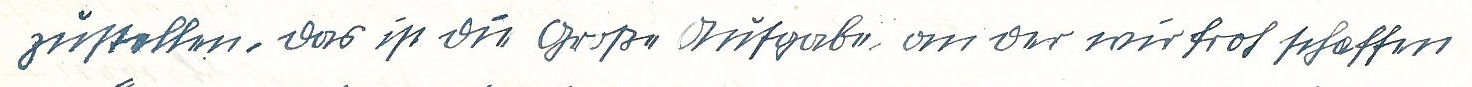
zustellen, das ist die große Aufgabe, an der wir froh schaffen
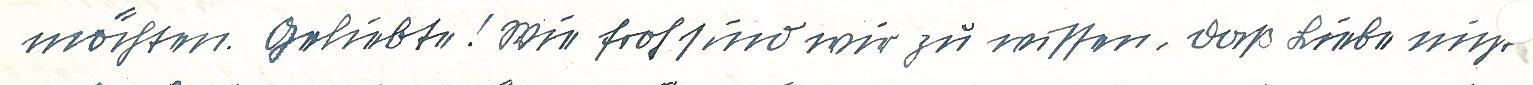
möchten. Geliebte! Wie froh sind wir zu wissen, daß Liebe nicht
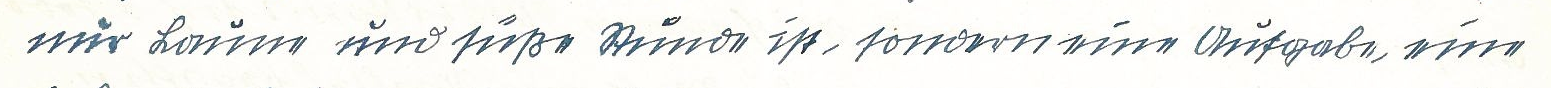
nur Laune und süße Stunde ist, sondern eine Aufgabe, eine
